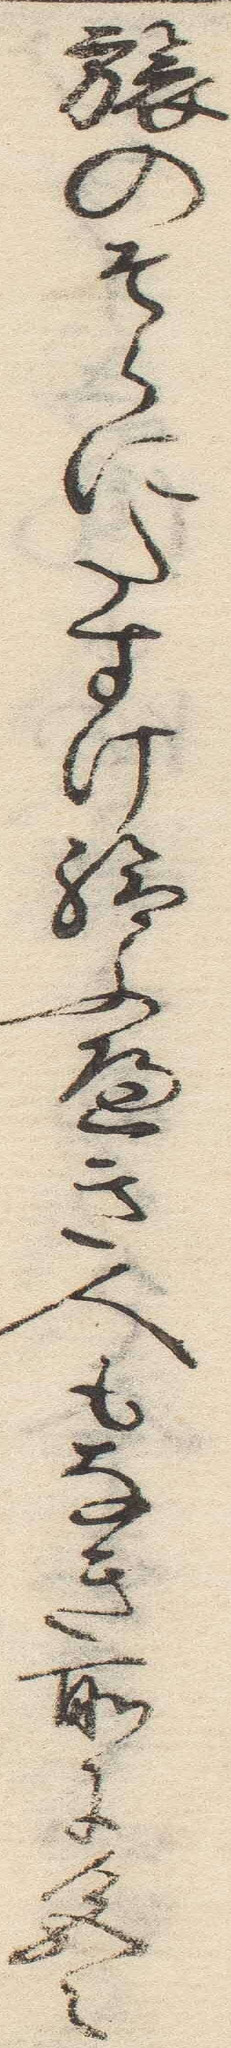旅のそらにたすけ給ふへき人もなき所に色々
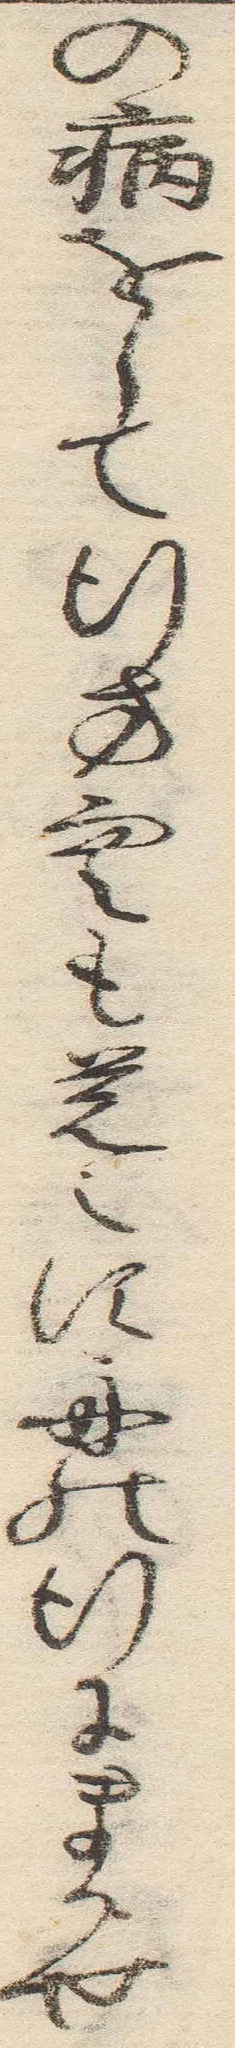の病をして行方空も覚えす舟の行にまかせ
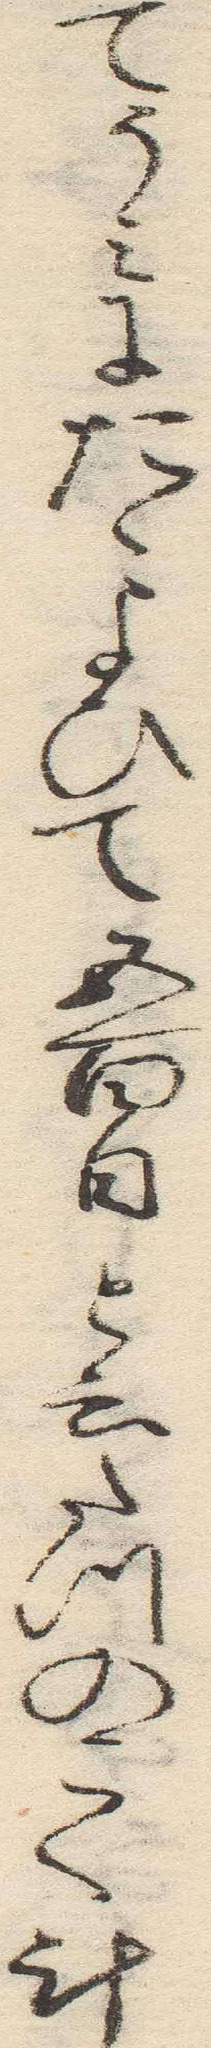てうみにたゝよひて五百日と云たつのこく計
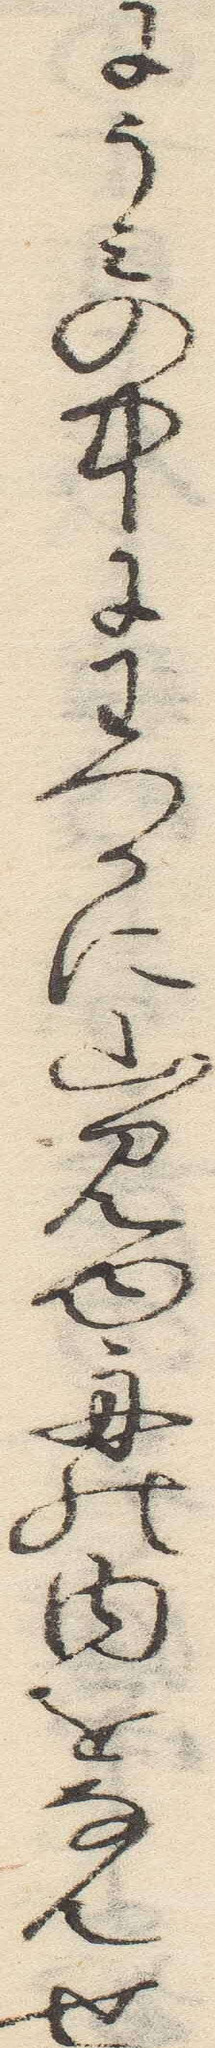にうみの中にわつかに山見ゆ舟の内をなんせ
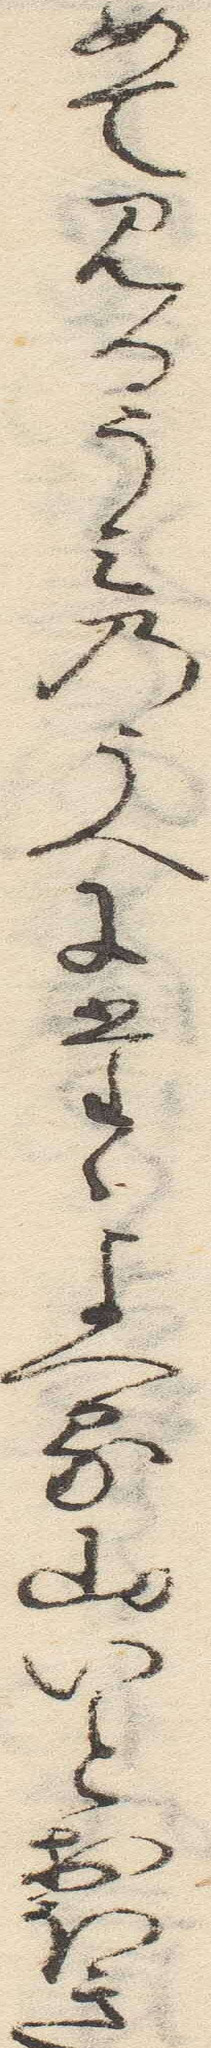めて見るうみのうへにたゝよへる山いとおほき
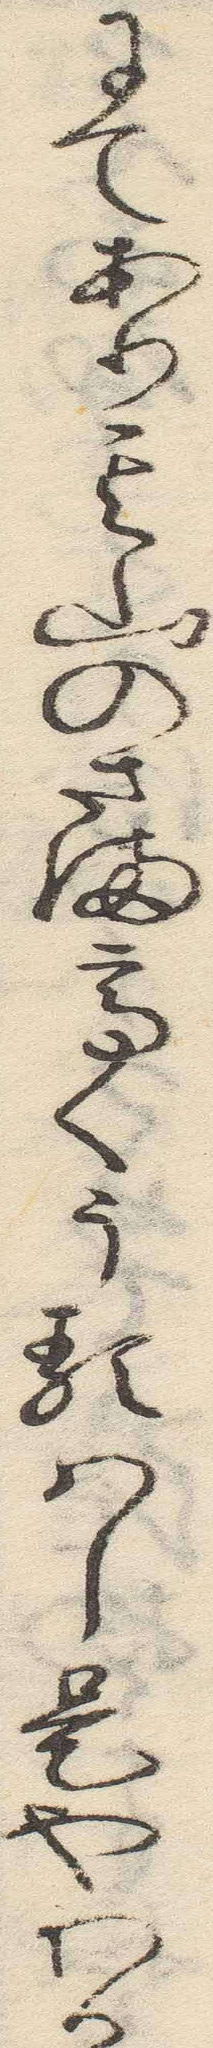にてあり其山のさま高くうるはし是やわか
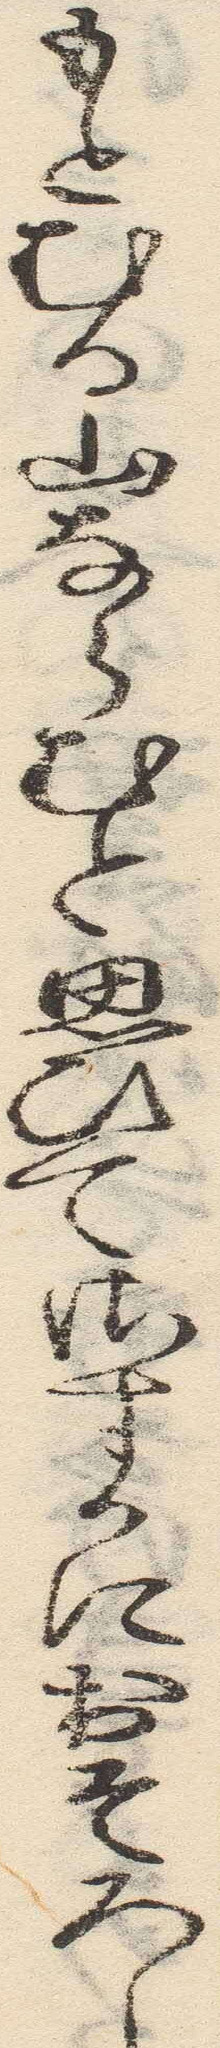もとむる山ならむと思ひてさすかにおそろし
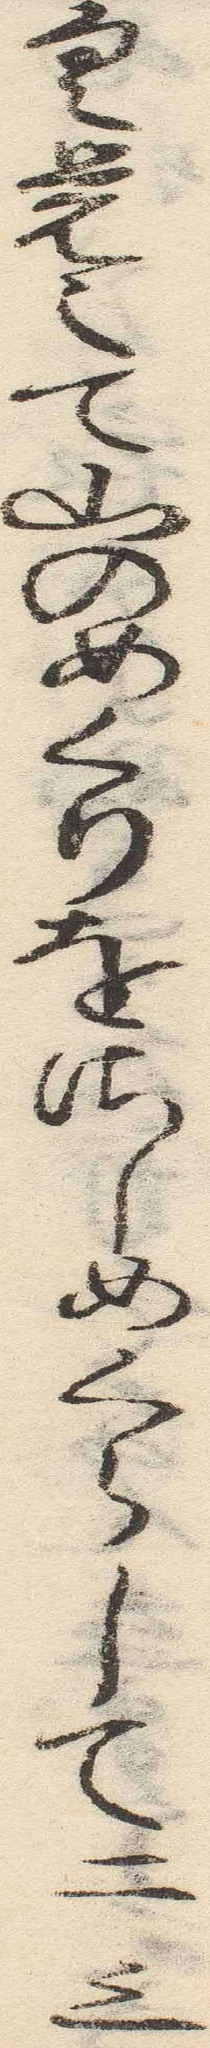く覚えて山のめくりをさしめくらして二三
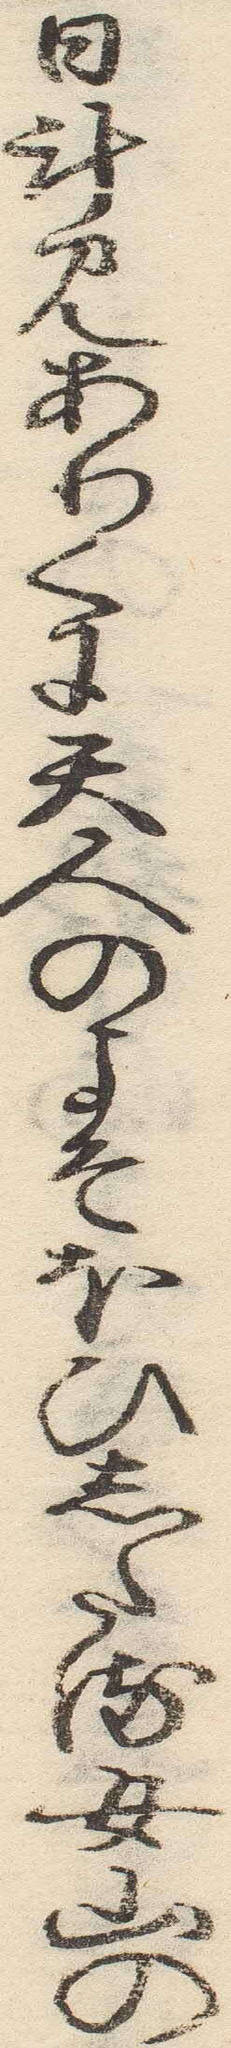日計見ありくに天人のよそほひたる女山の
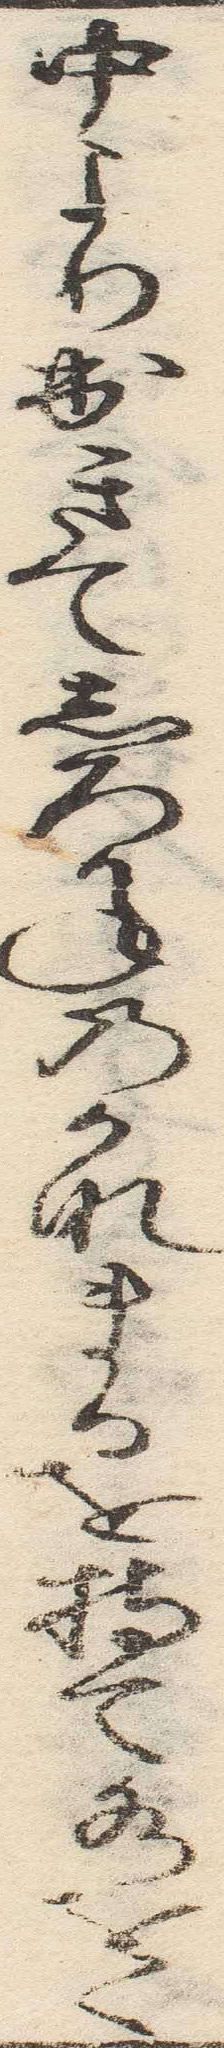中より出きてしろかねのかなまるを持て水をく
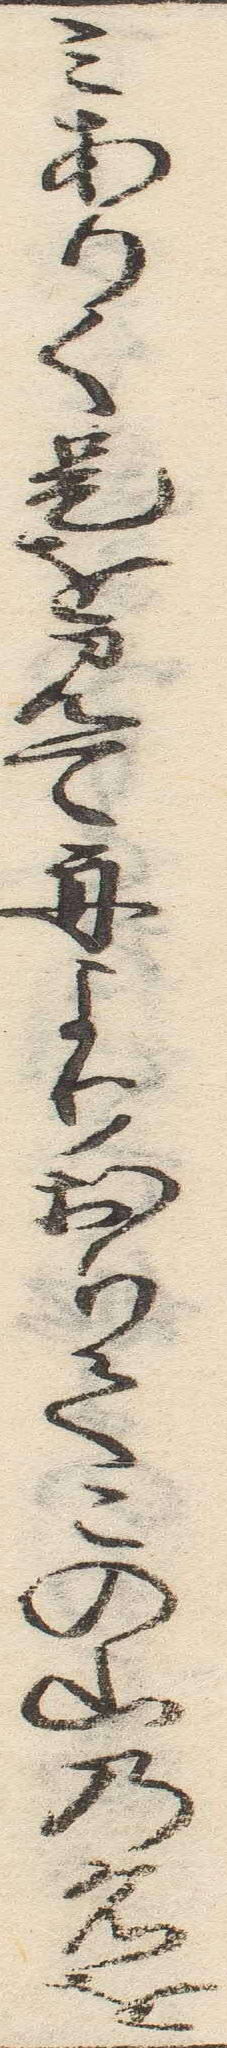みありく是を見て舟よりおりてこの山の名を
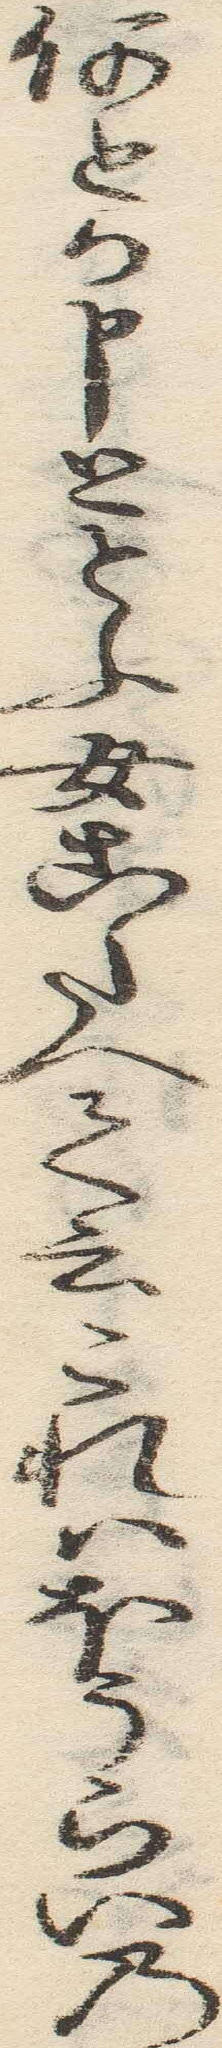何とか申ととふ女こたへて云これはほうらいの
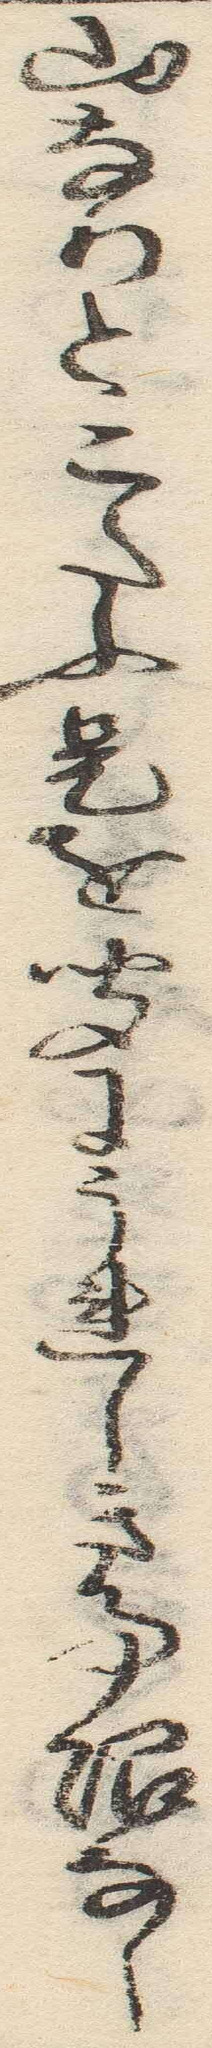山なりとこたふ是を聞にうれしき事限なし
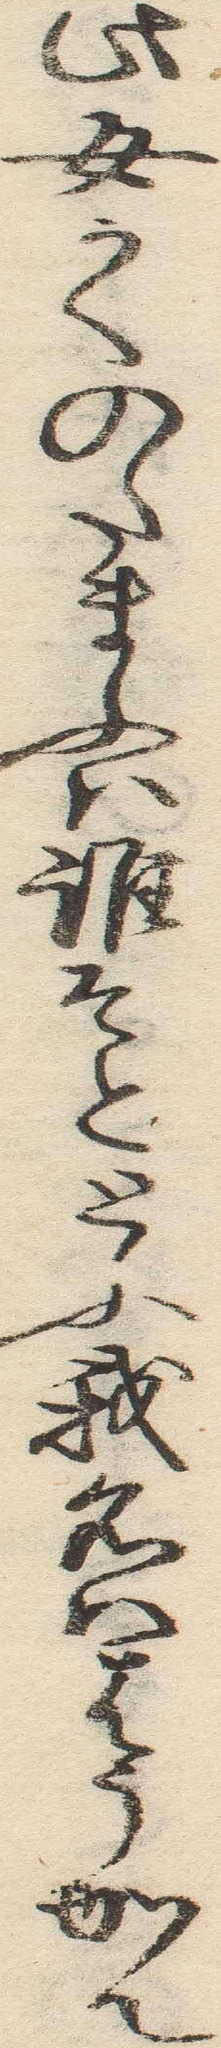此女かくのたまふは誰そととふ我名ははうかん
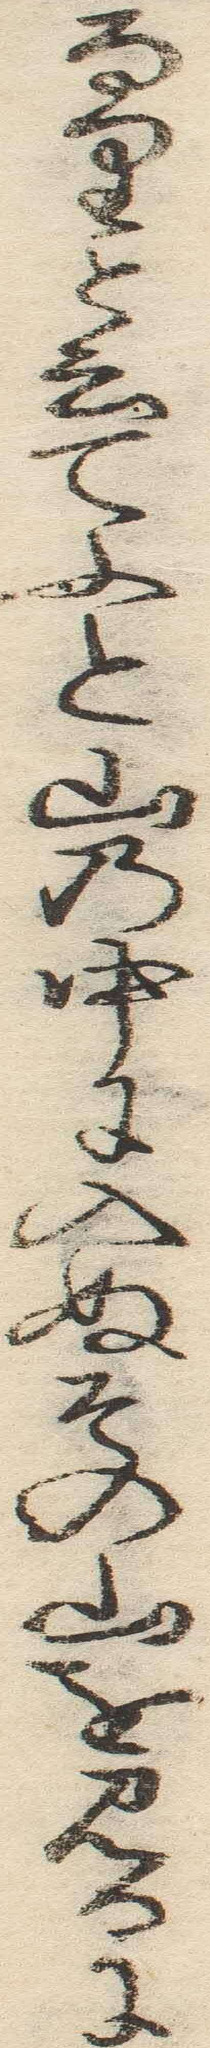るりと云てふと山の中に入ぬその山を見るに
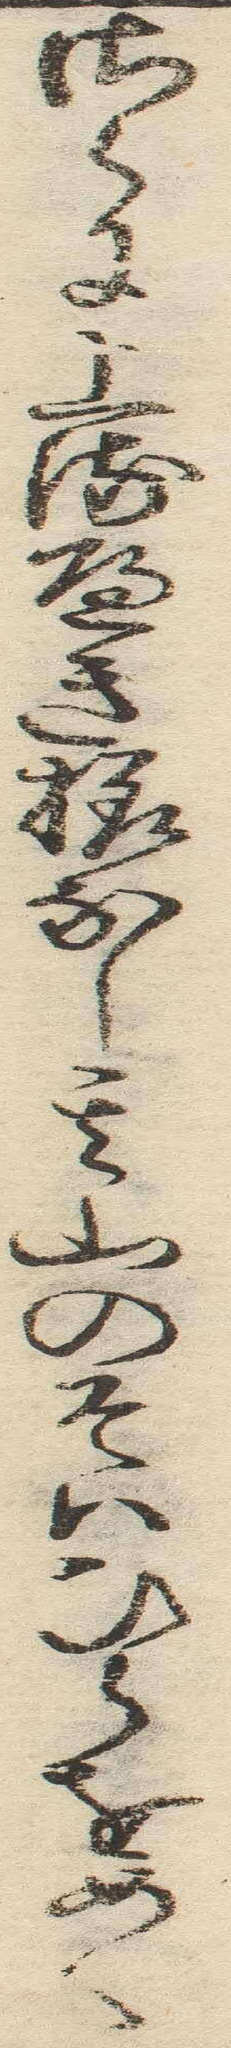さらに上るへき様なし其山のそはひらをめく
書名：竹取物語
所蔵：東京学芸大学附属図書館 国文学研究資料館
